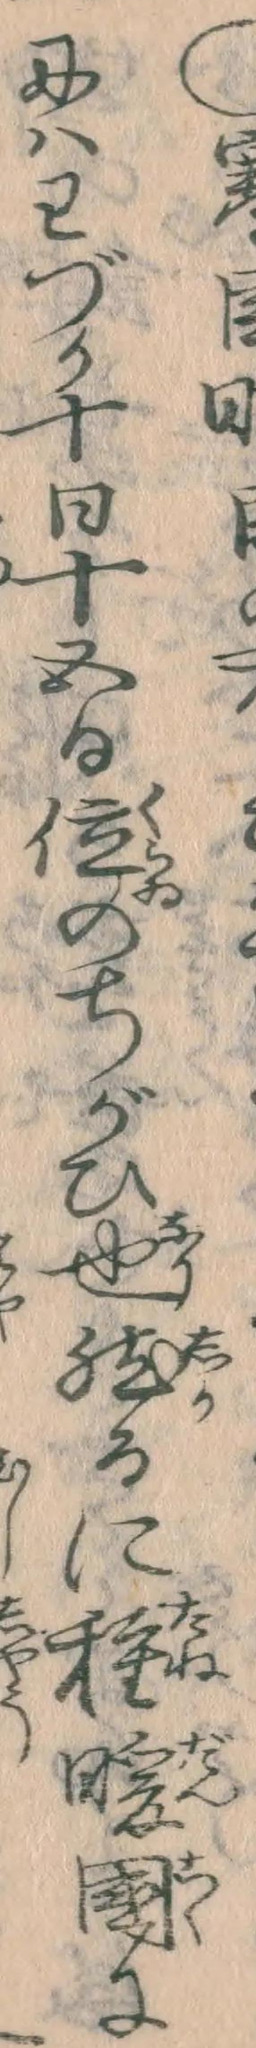にはわづか十日十五日位のちがひ也然るに種暖国に
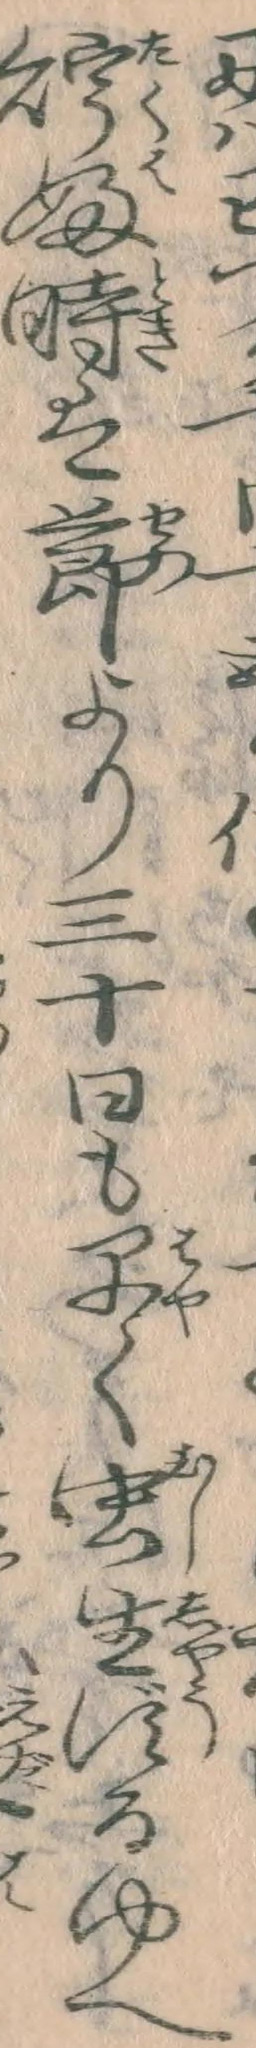貯ふ時は節より三十日も早く虫生ずるゆへ
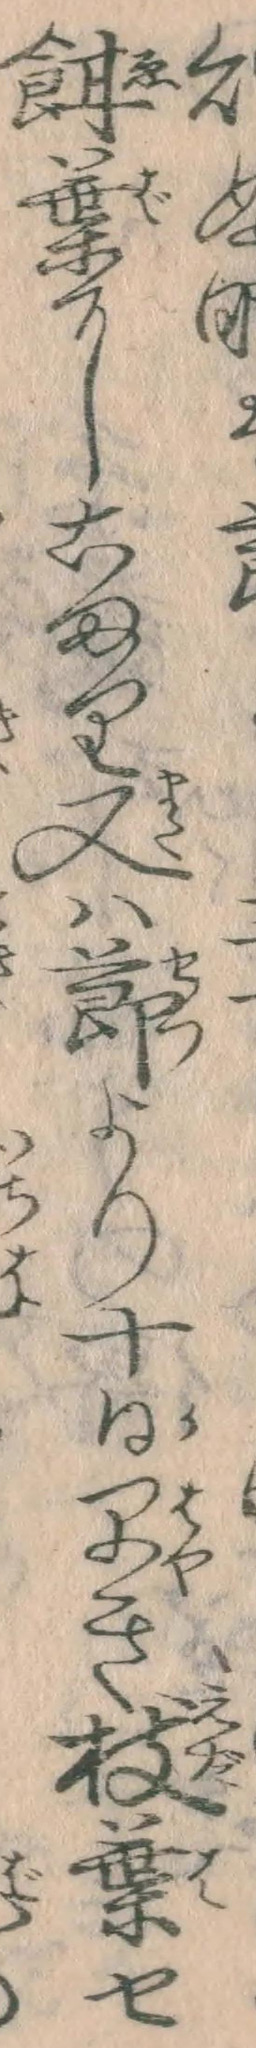餌葉にこまり又は節より十日早き枝葉せ
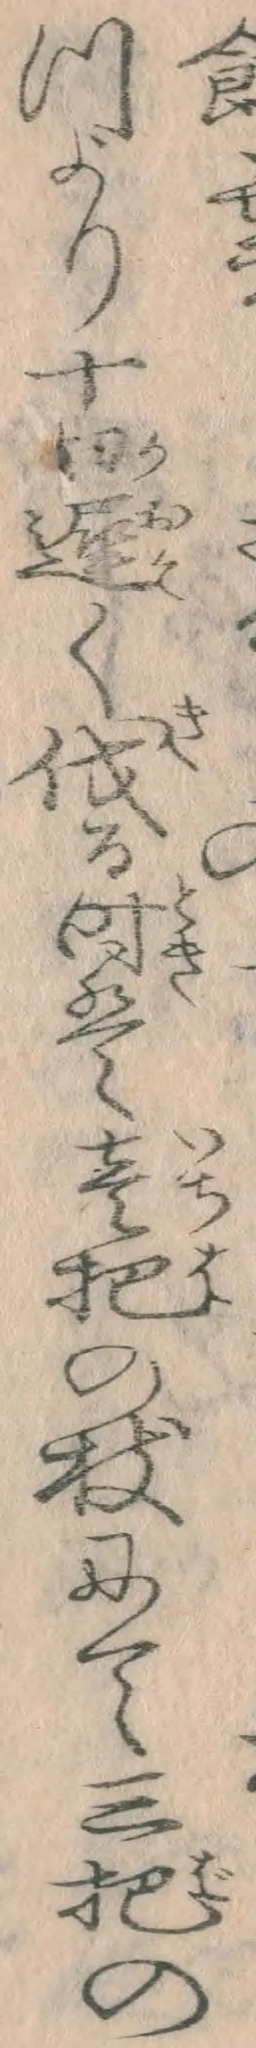つより十日遅く伐る時は壱把の枝にて三把の
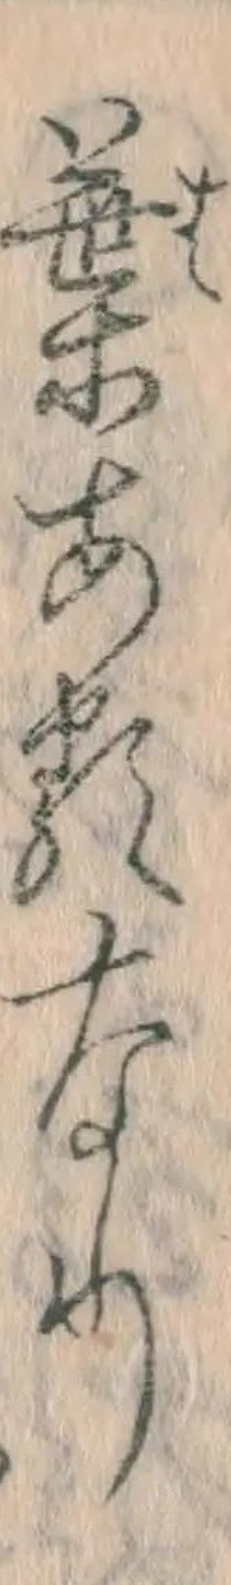葉あるなり
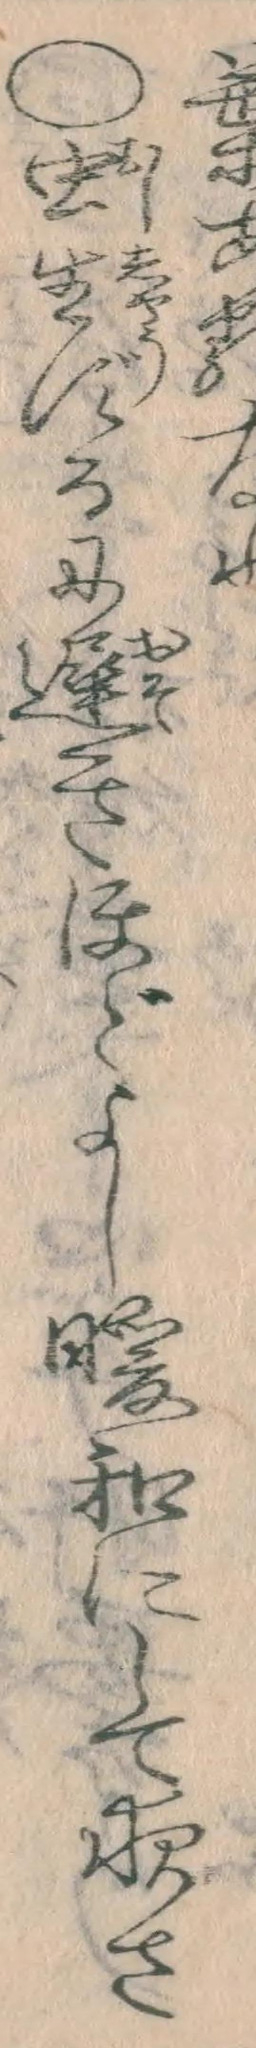○虫生ずるに遅きほどよし暖和にして夜さ
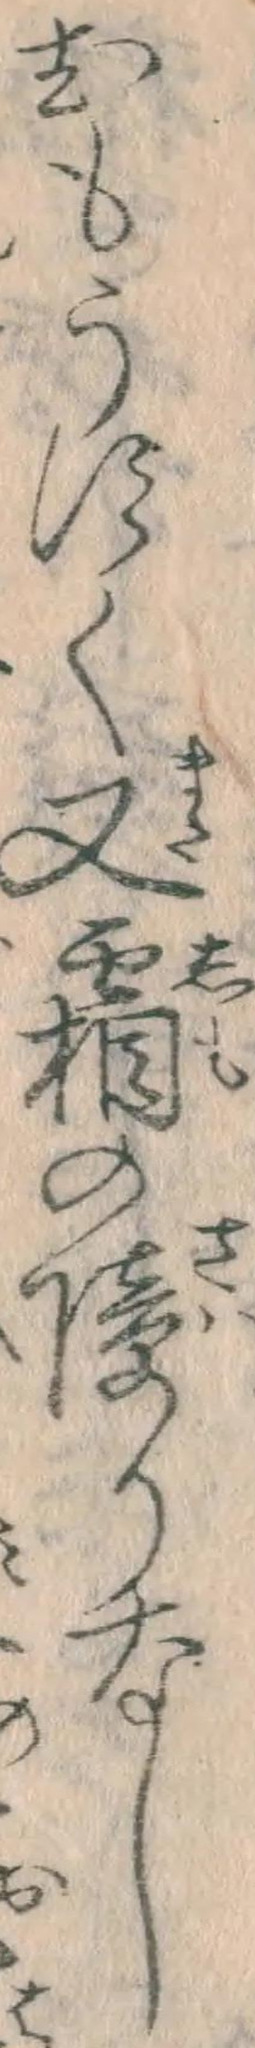むもうすく又霜の障りなし
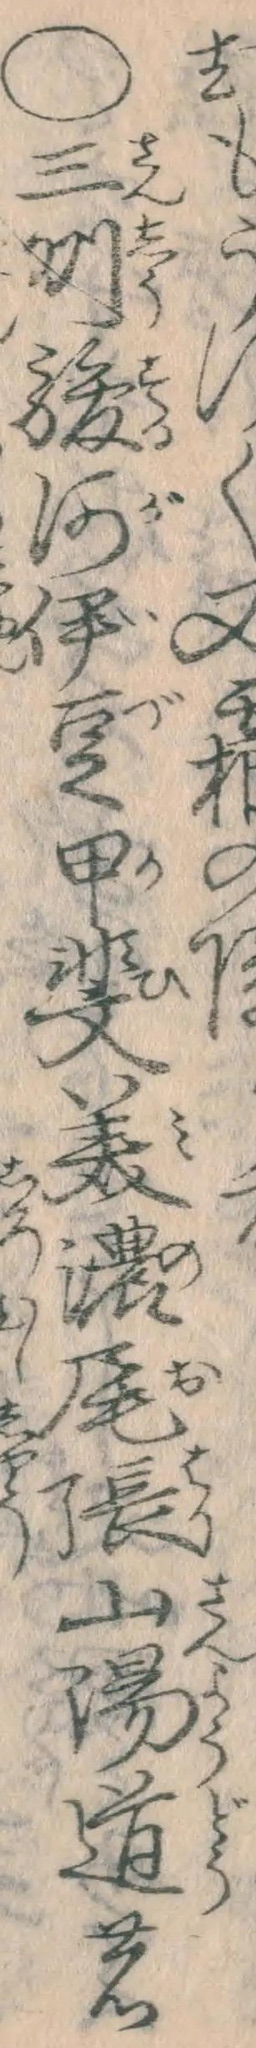○三州駿河伊豆甲斐美濃尾張山陽道の
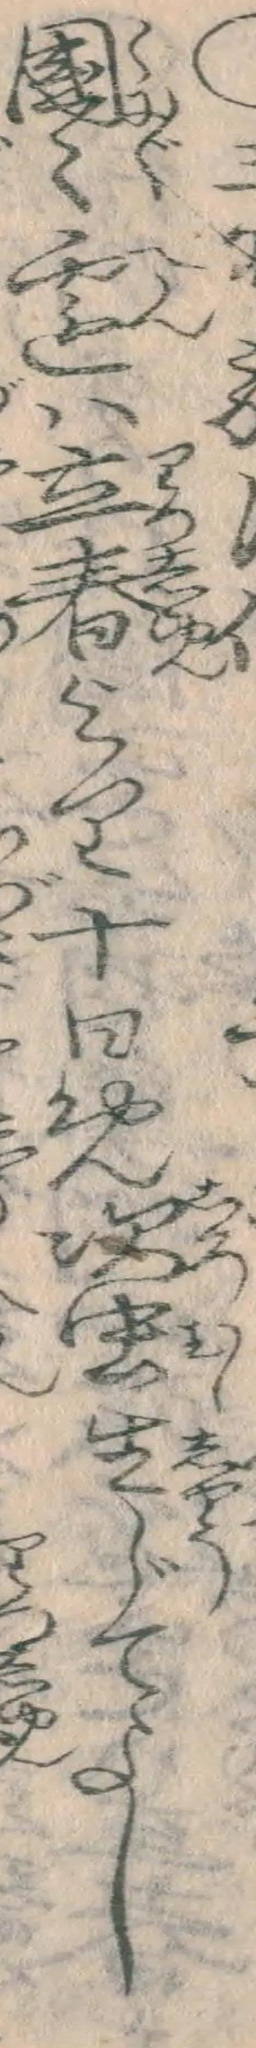国々辺は立春より十日め次虫生じてよし
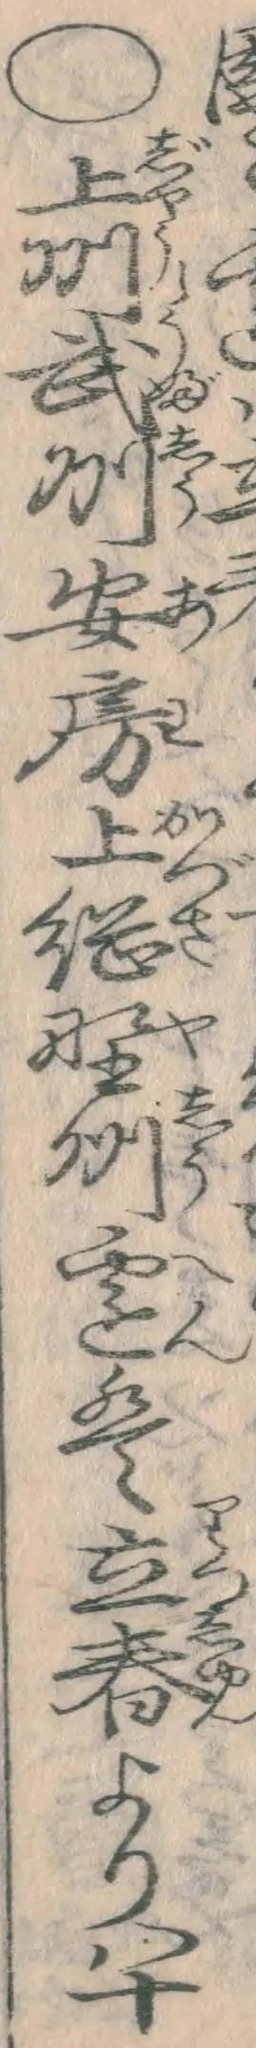○上州武州安房上総野州辺は立春より八十

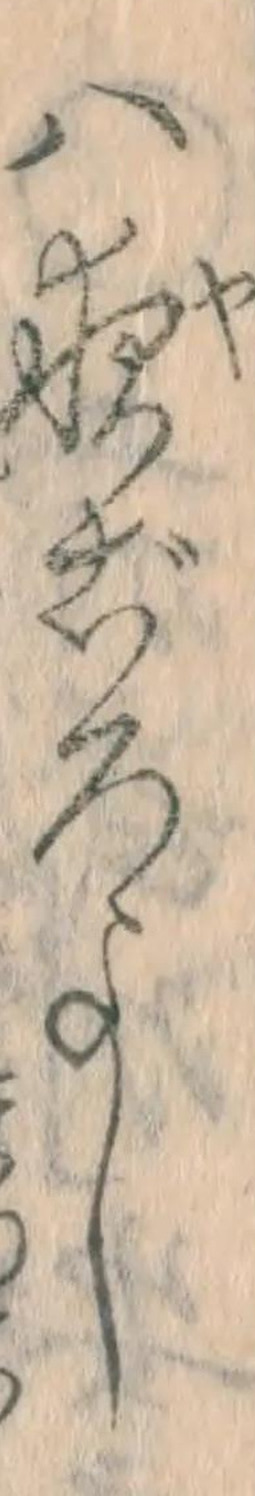八夜ごろよし
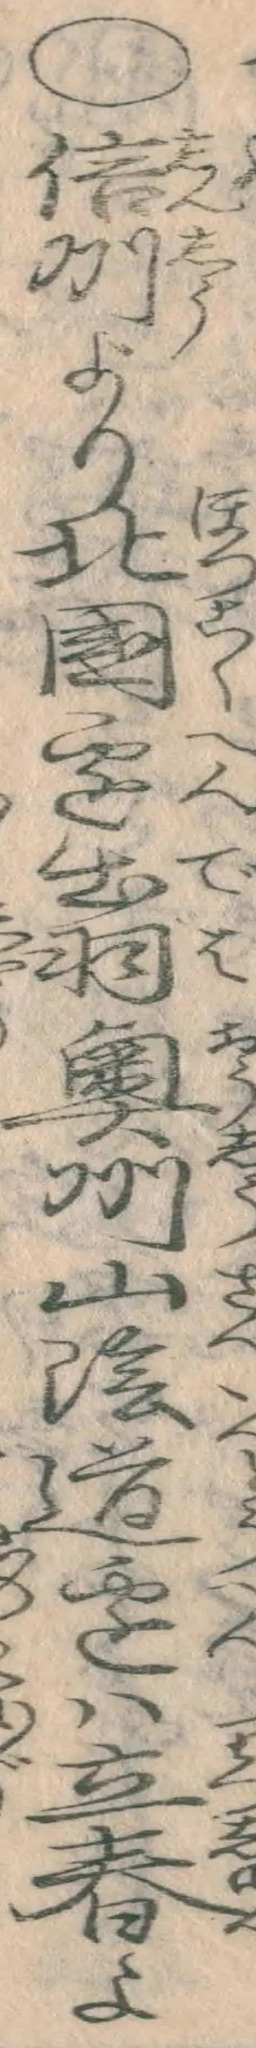○信州より北国辺出羽奥州山陰道辺は立春よ
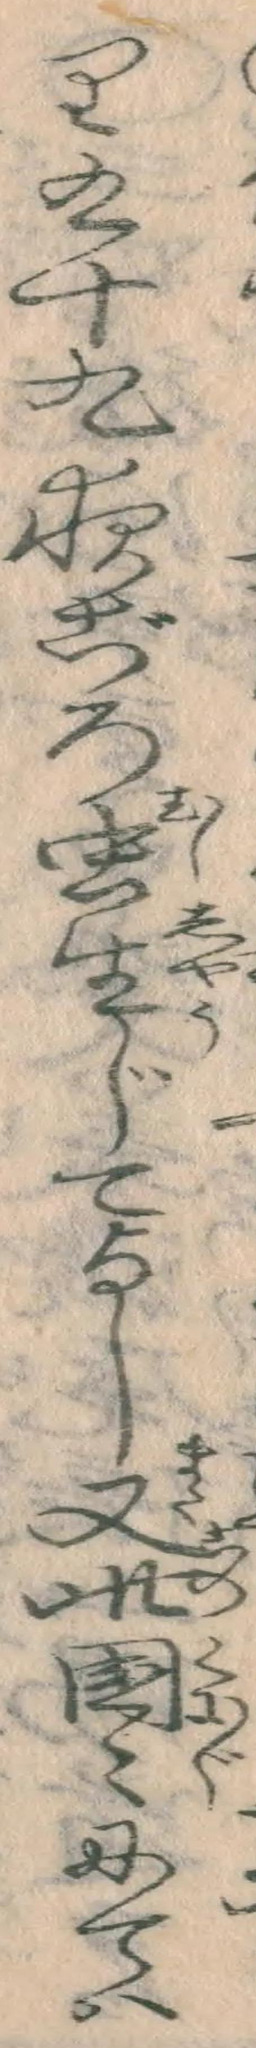り九十九夜ごろ虫生じてよし又此国々にては
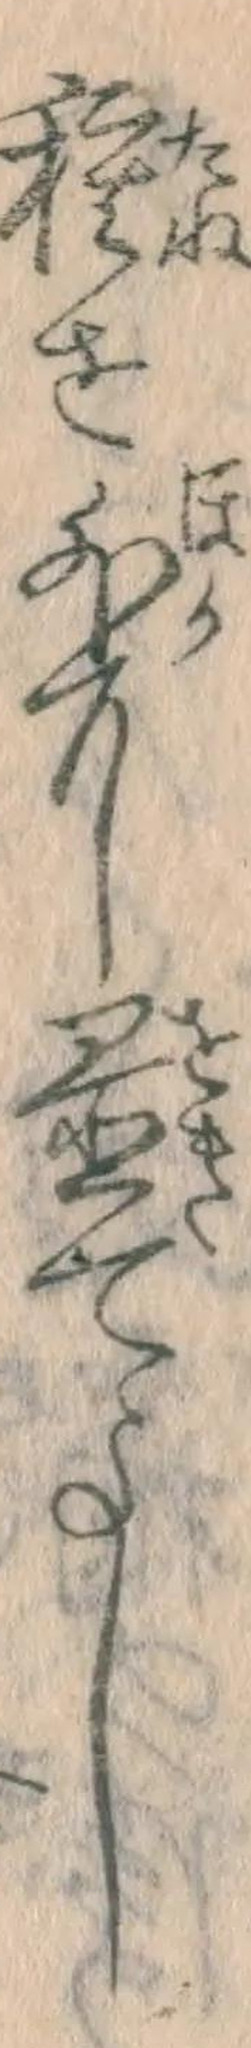種を外に置てよし
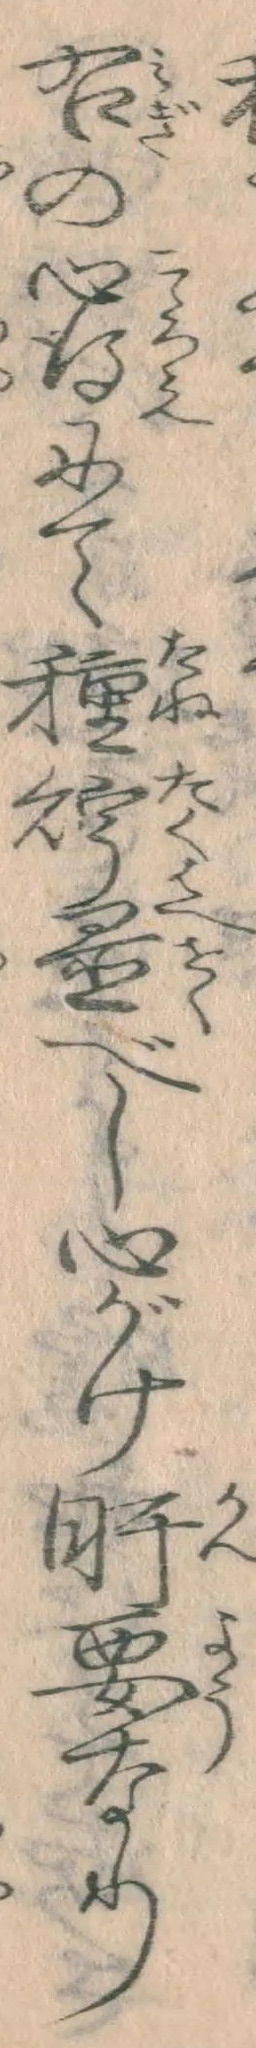右の心得にて種貯置べし心がけ肝要なり
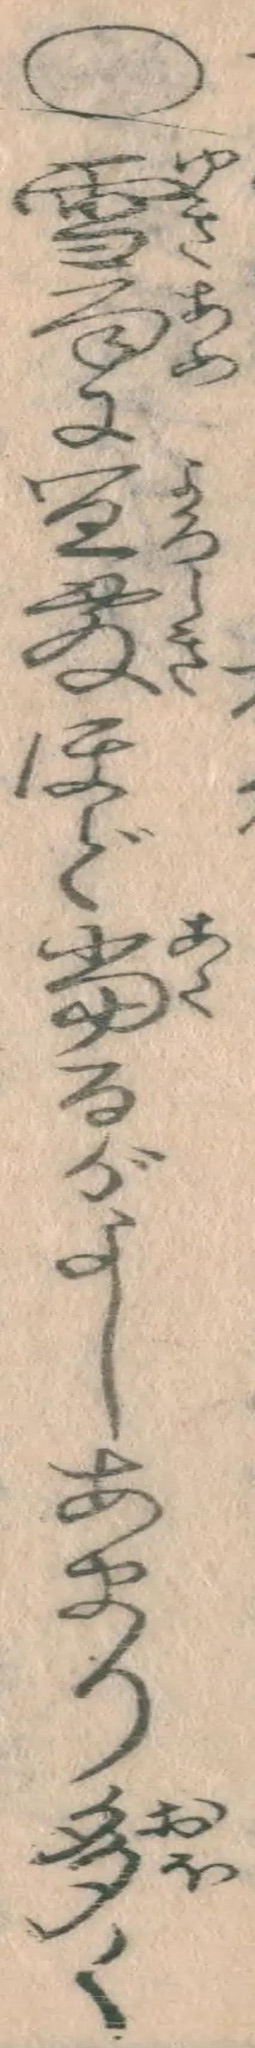○雪雨に宜敷ほど当るがよしあまり多く
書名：山繭養法秘傳抄
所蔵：国立国会図書館 National Diet Library, JAPAN
